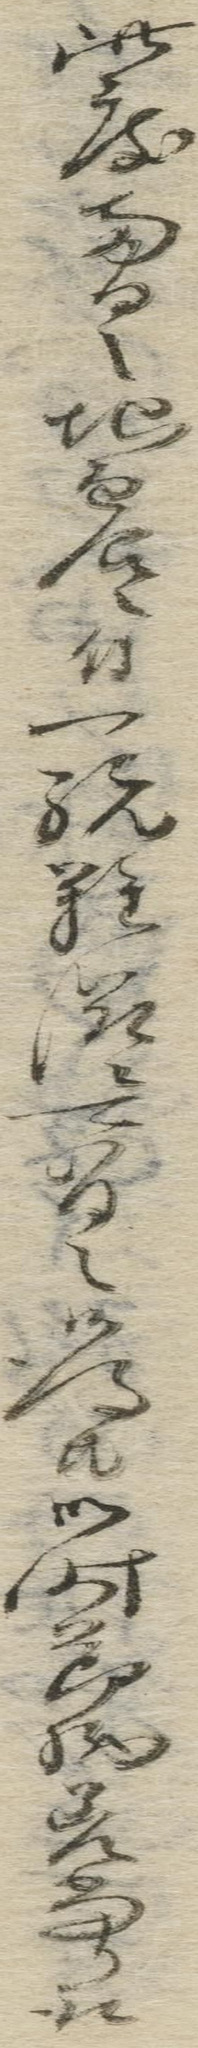此度両日之地震二付一統難渋二可有之候得共御時節柄差当り取
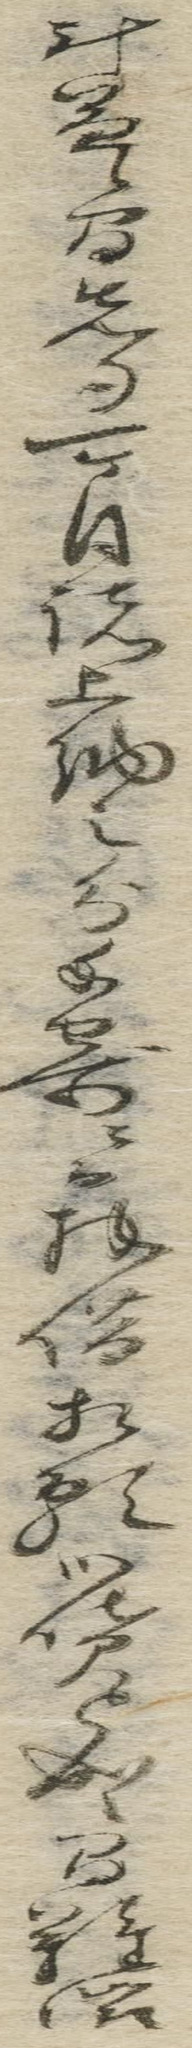計兼候間先ツ一ヶ月諸上納之分手寄二而拝借相願御貸被成候間難渋
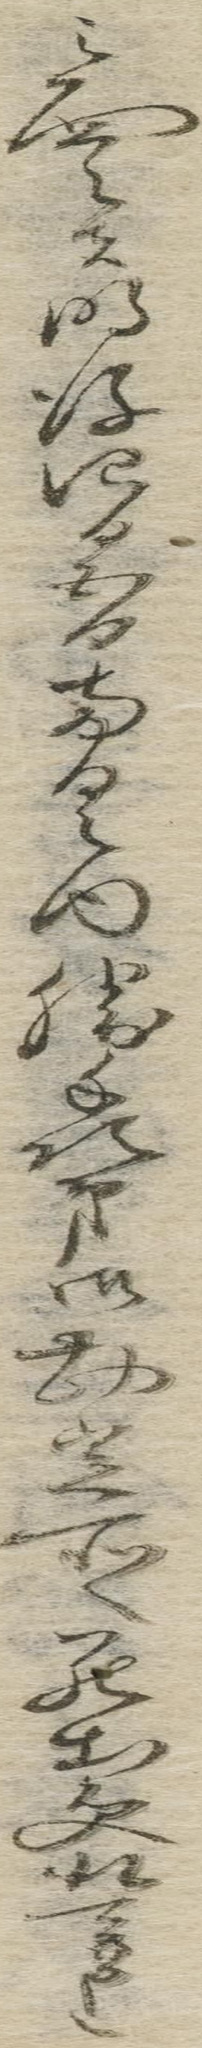之面々は明後四日五日両日之内勝手次第御勘定所へ罷出受取可被申候
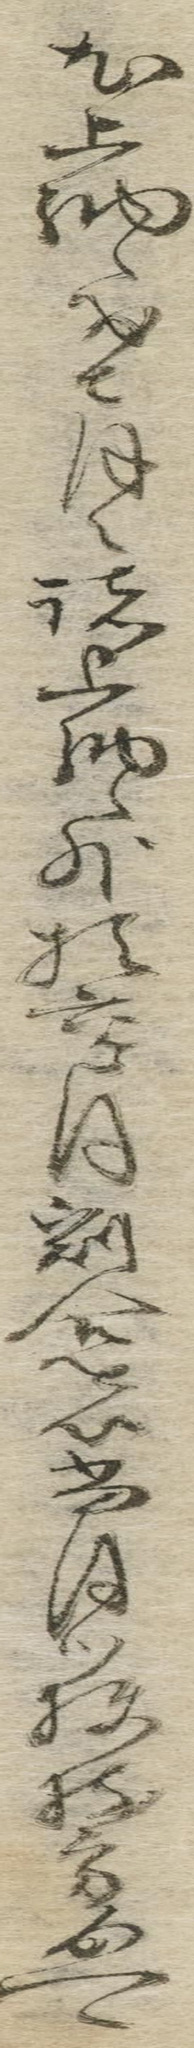尤上納之義は月々諸上納外於六ヶ月割合を以当月御扶持方ゟ可
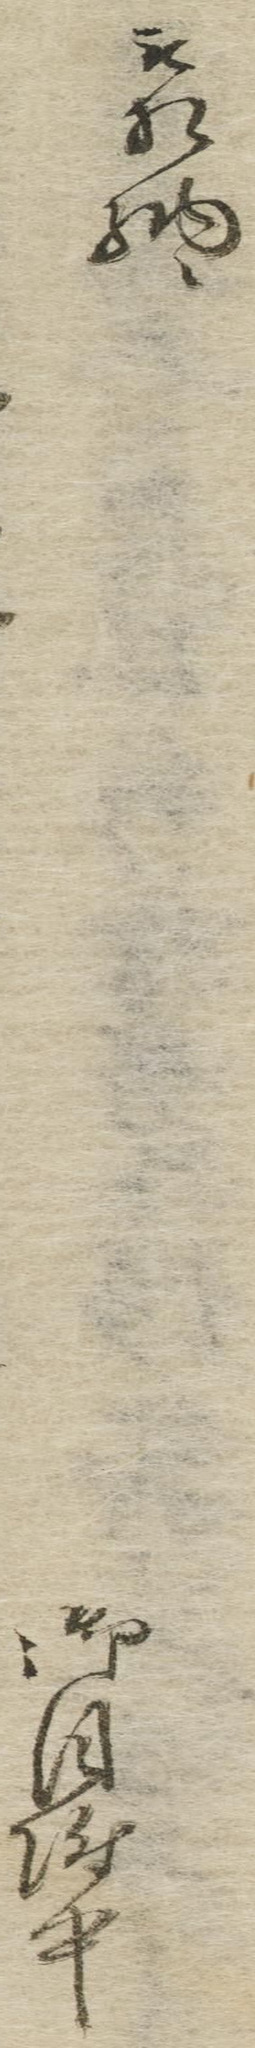被相納候御目付中
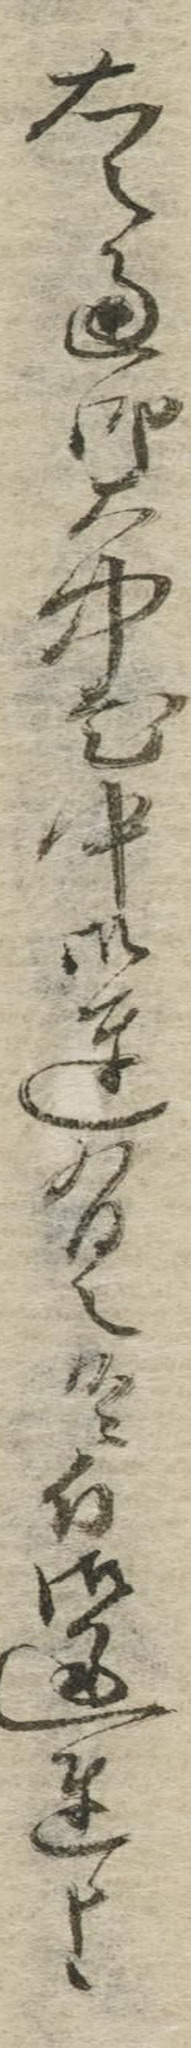右之通御大中老中御達有之候二付御通達申候
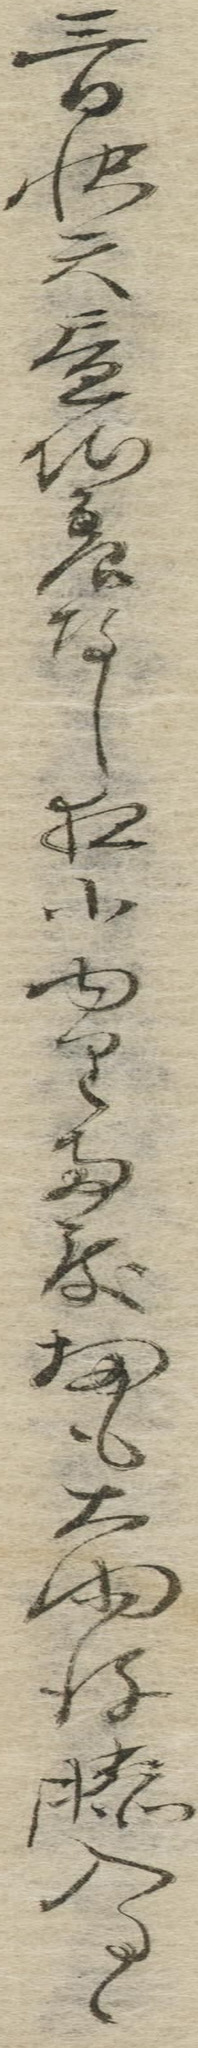三日快天昼地震なし夜小ゆり両度扨も大雨後膝入る候

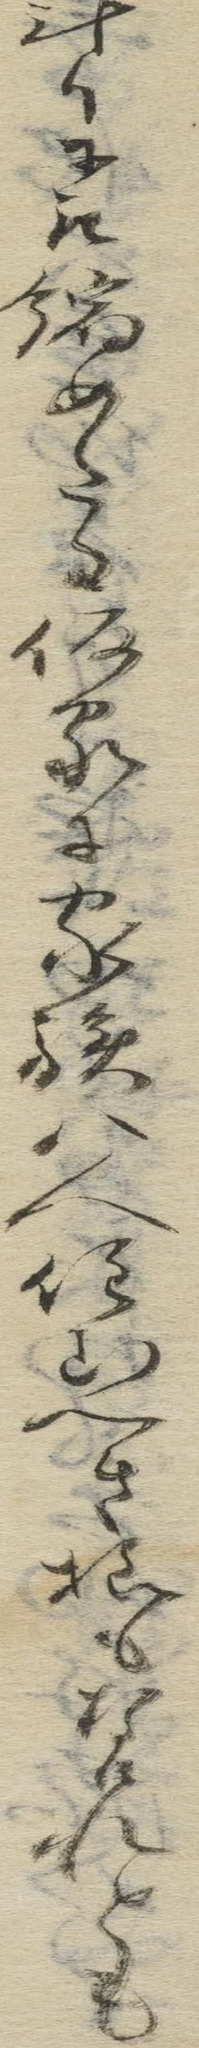計りに取縮めたる仮家家族八人住むへき様もなけれとも
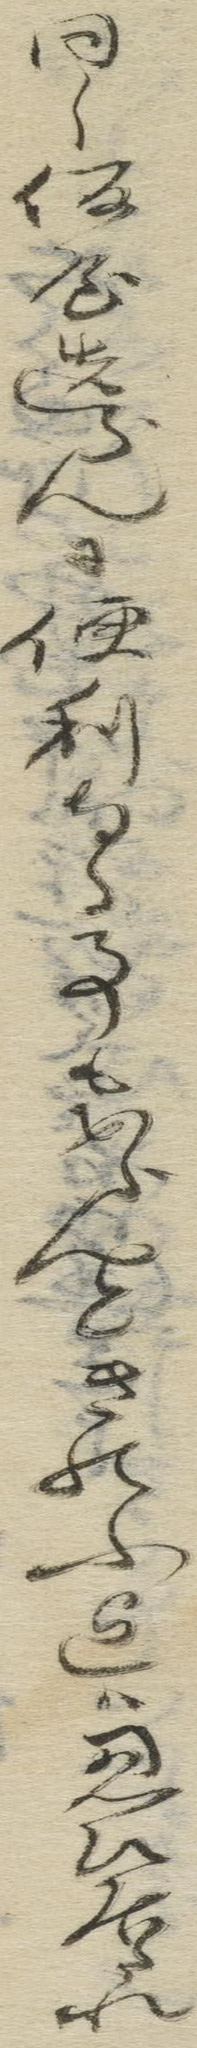同し仮屋造らんに便利なる事もあらんときのふ迄ハ忍ひ居たれ
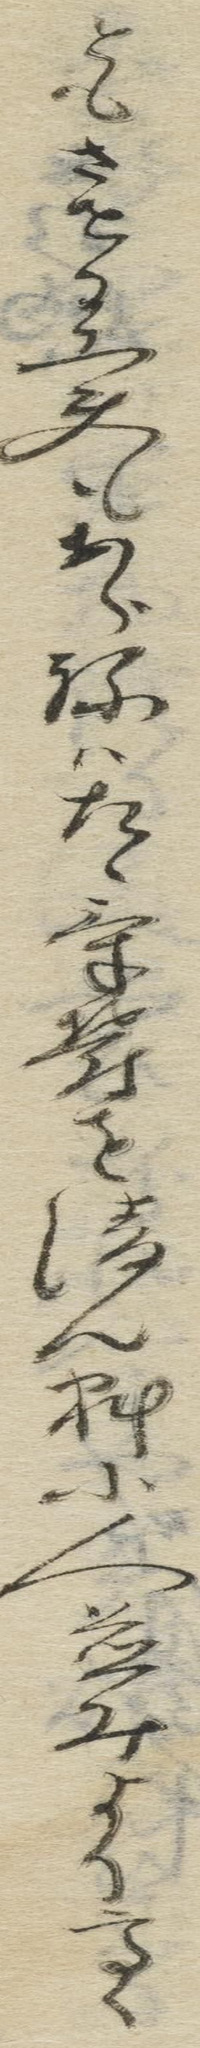ともさをに工夫もあらねハたゝ気欝を凌ん抑小人営みより高く
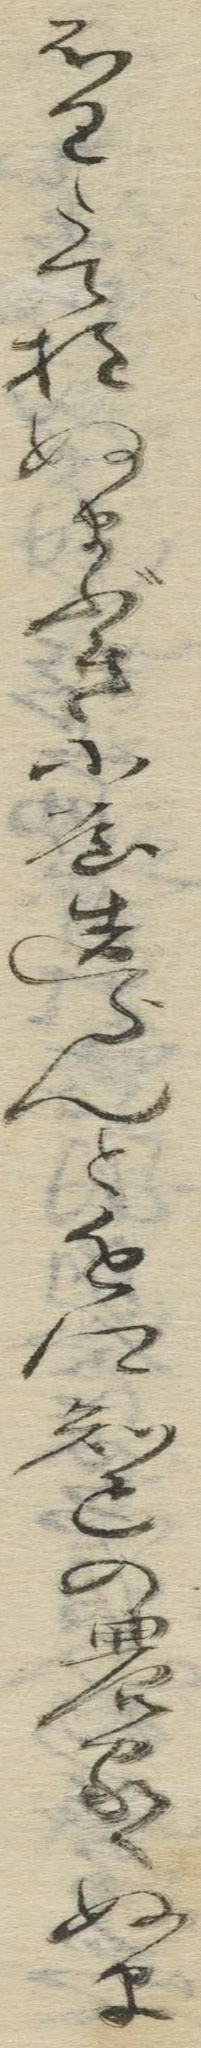ほりたて柱ぬまぶき小屋造らんと近郷知己の農家へぬま
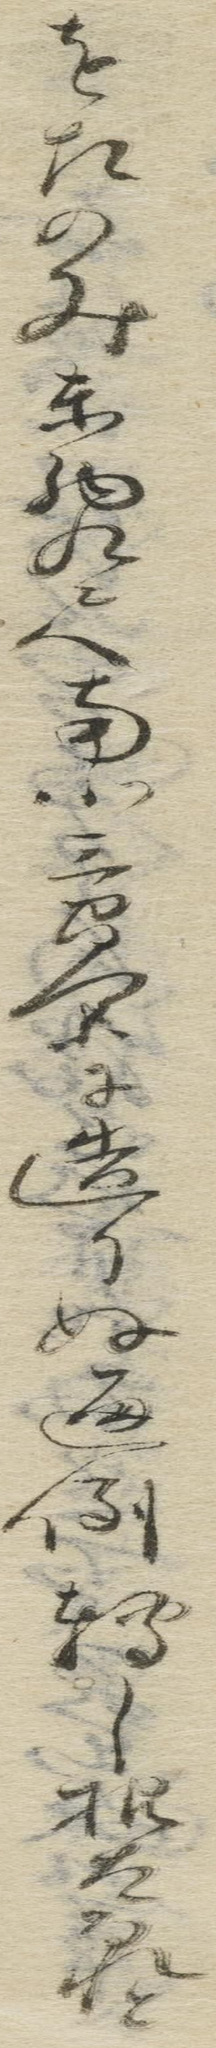をたのみ東西九尺南北三間余に造りぬ通例転し根太なれと
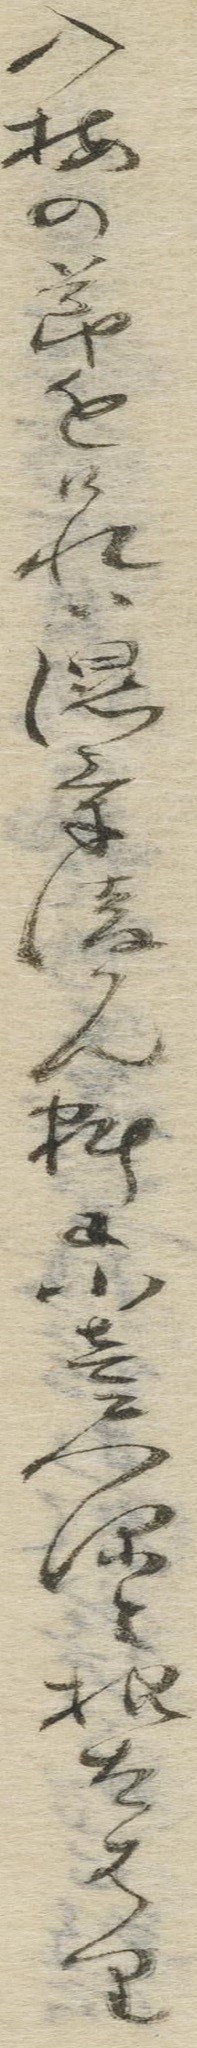入梅の節近けれハ湿気凌かんに小壱尺深く根太はり
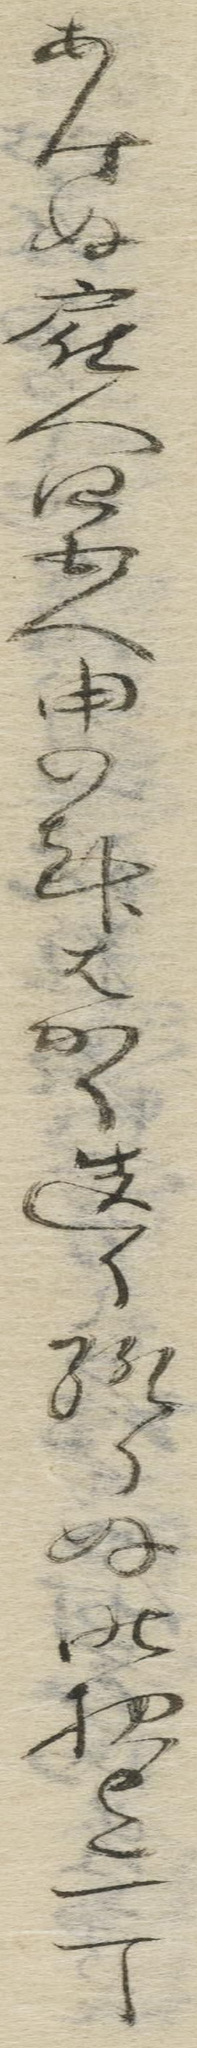あけぬ雇人四五人申の刻はかり造り終りぬ昨夜迄一丁
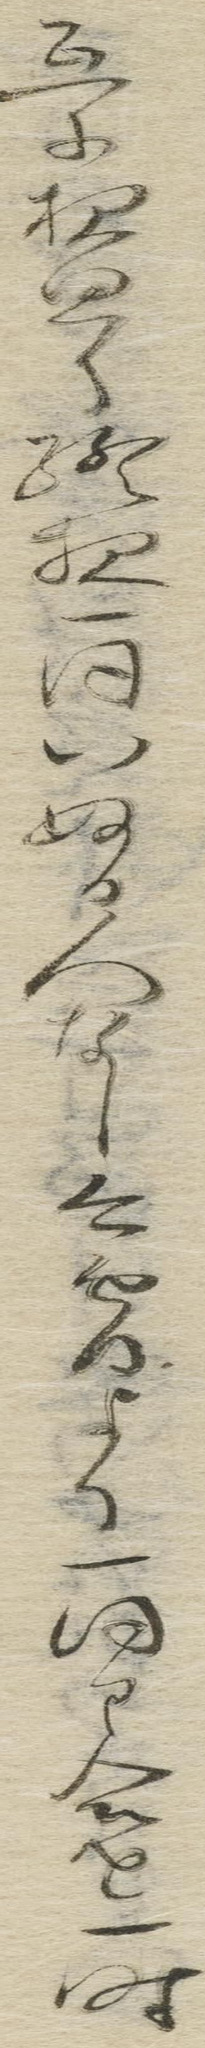互に夜回り終夜一同いぬる人なし今宵より一同申合を一時
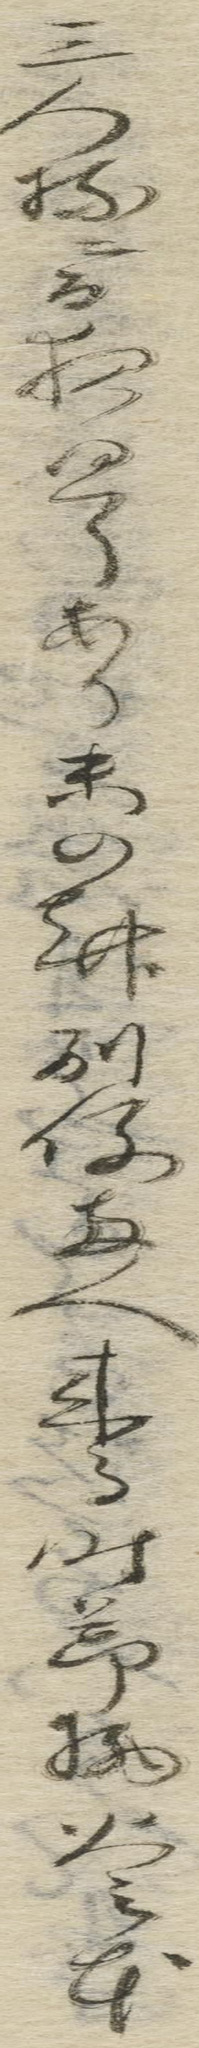三人抔二而夜回りあり未の刻別役両人来る時節柄火之本
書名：弘化丁未天變日記
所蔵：東京大学地震研究所図書室 Earthquake Research Institute Library, The University of Tokyo, JAPAN
